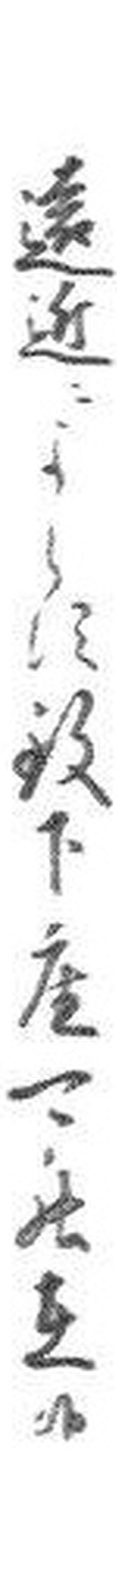遠近ニよらす致下座可罷在候
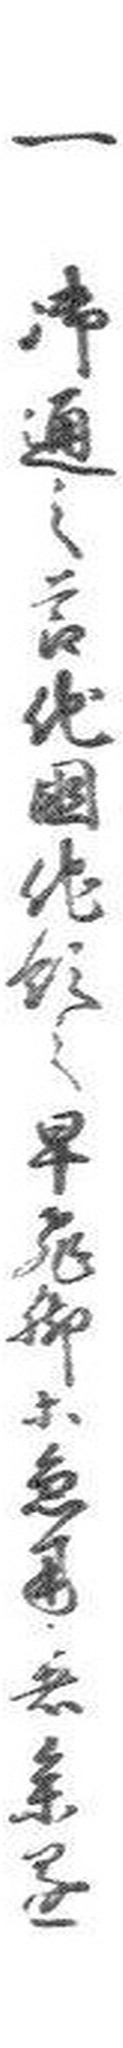一御通之節他国他領之早飛脚等急用之者参懸
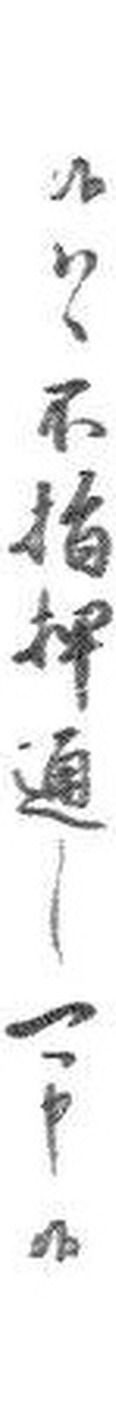候ハゝ不指押通し可申候
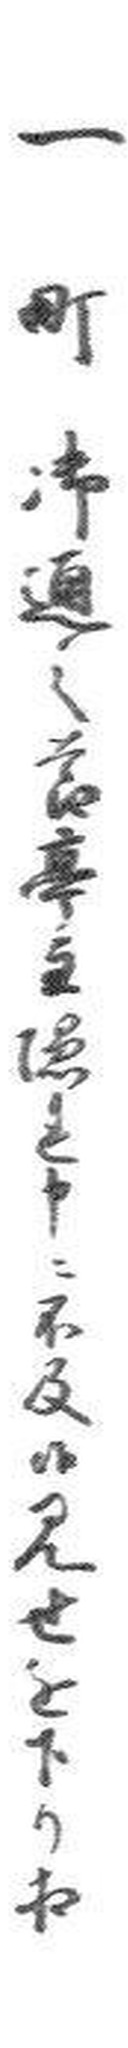一町御通之節亭主隠れ申ニ不及候見せを下り相
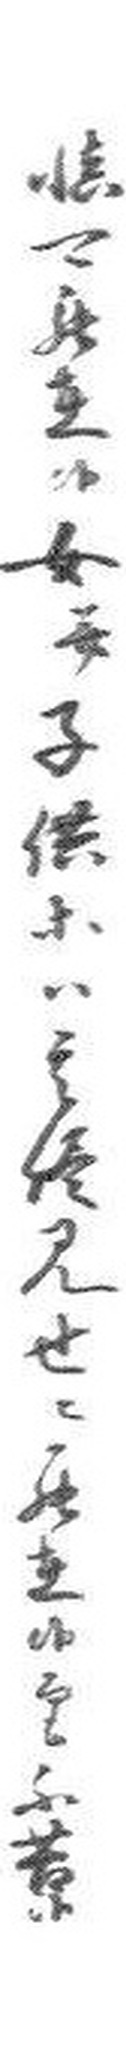慎可罷在候女并子供等ハ其儘見せニ罷在候而も不苦候
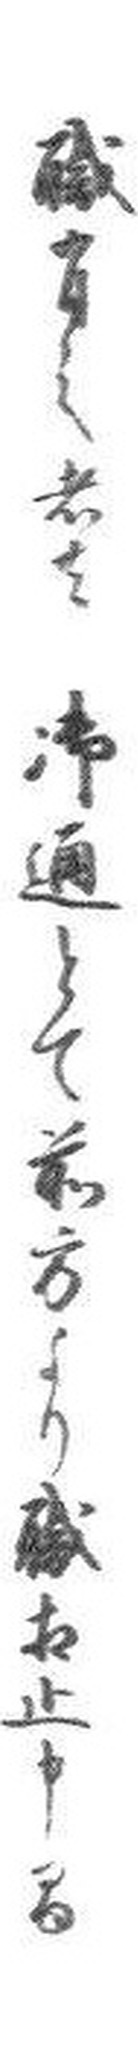職有之者共御通とて前方より職相止申し間

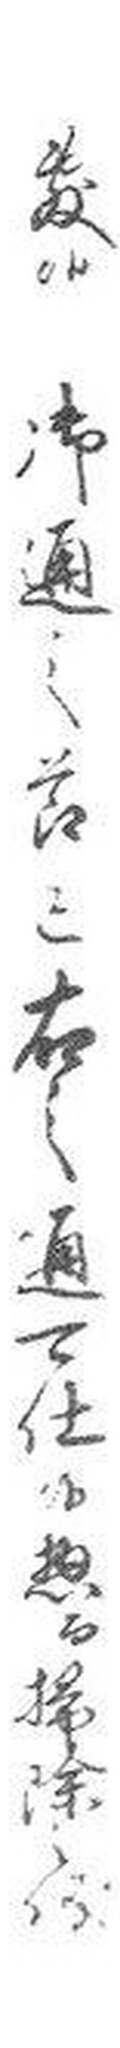敷候御通之節迄右之通可仕候惣而掃除之儀
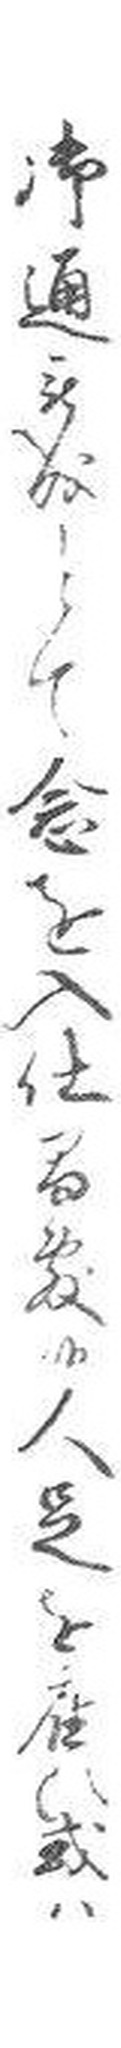御通被成とて念を入仕間敷候人足を雇ひ或ハ
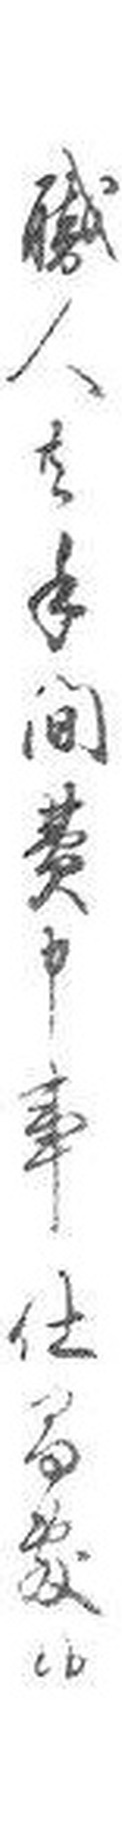職人共手間費申事仕間敷候
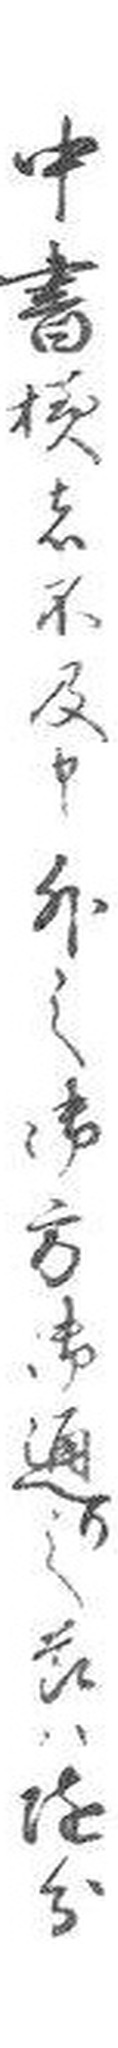中書様者不及申外之御方御通り之節ハ随分
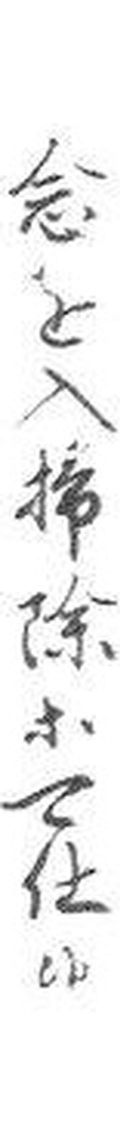念を入掃除等可仕候
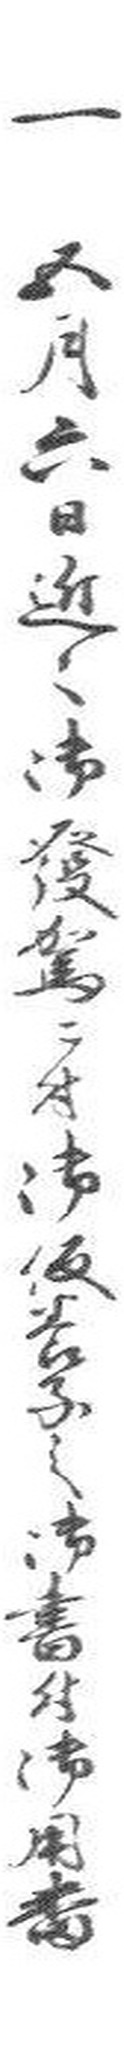一五月六日近く御発駕ニ付御仮養子之御書付御用番
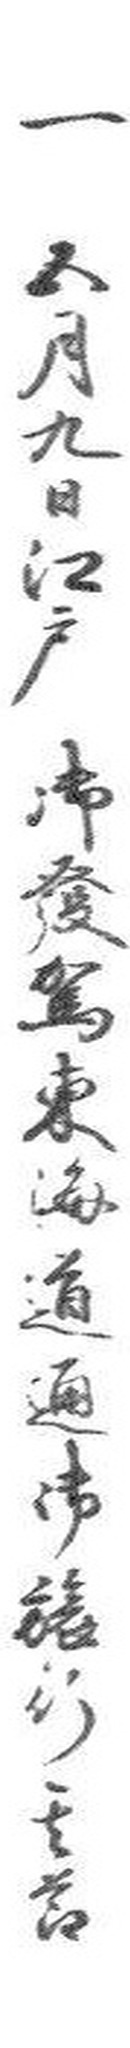一五月九日江戸御発駕東海道通御旅行其節
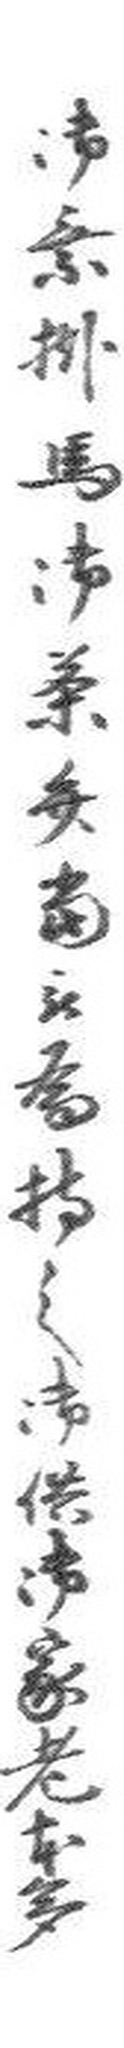御乗掛馬御茶弁当被持之御供御家老本多
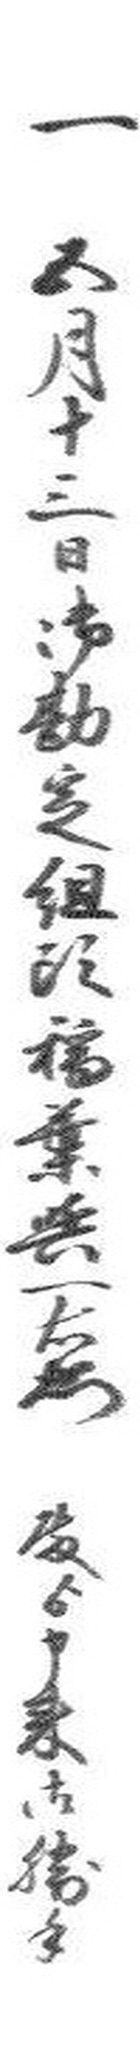一五月十三日御勘定組頭稲葉与一右衛門殿ゟ申来御勝手
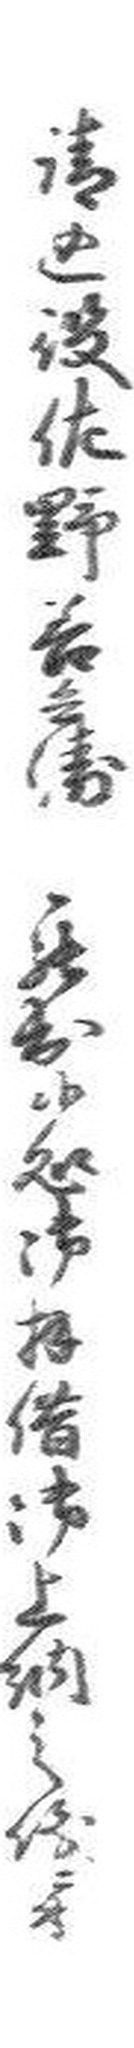請込役佐野善兵衛罷出候処御拝借御上納之儀ニ付
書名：家譜 二十九 吉邦公 従正徳二年到正徳三年
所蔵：福井県文書館 Fukui Prefectural Archives
